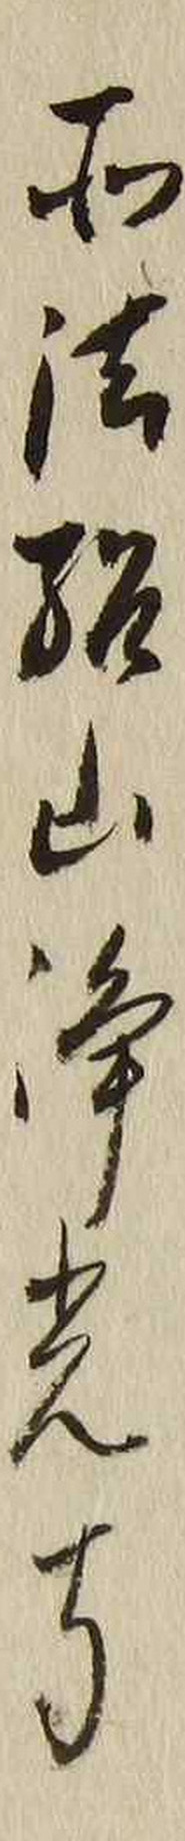所法紹山浄光寺

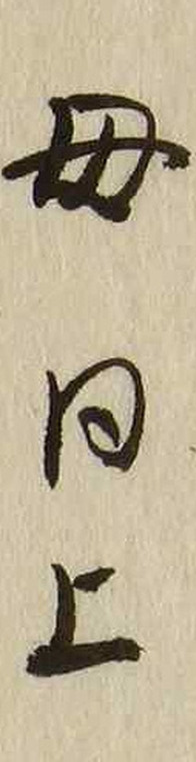母同上
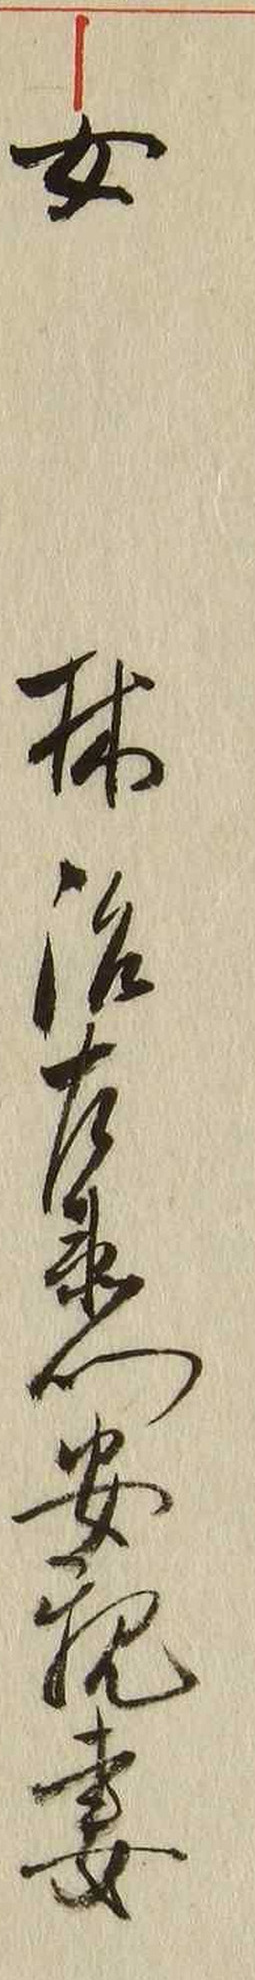女林治左衛門安親妻
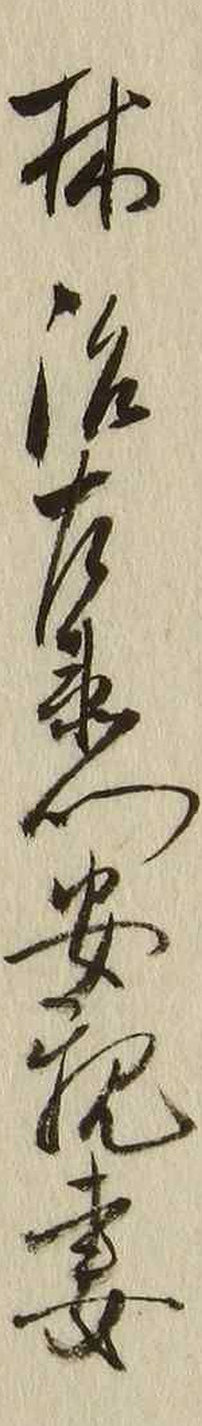女林治左衛門安親妻
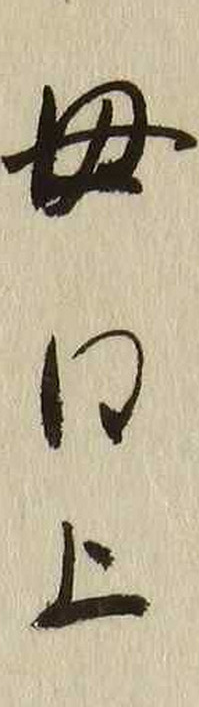母同上
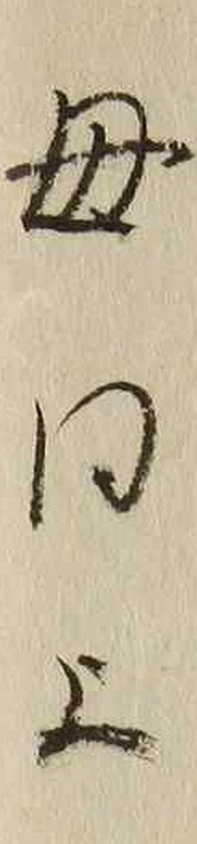母同上
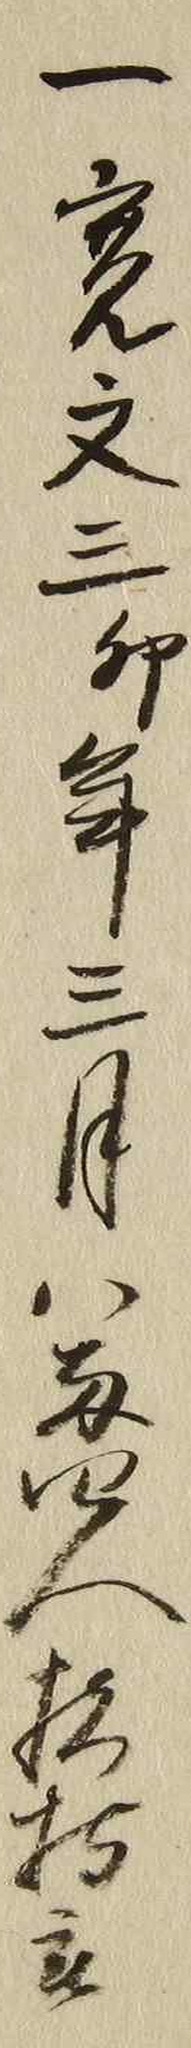一寛文三卯年三月八両四人扶持被
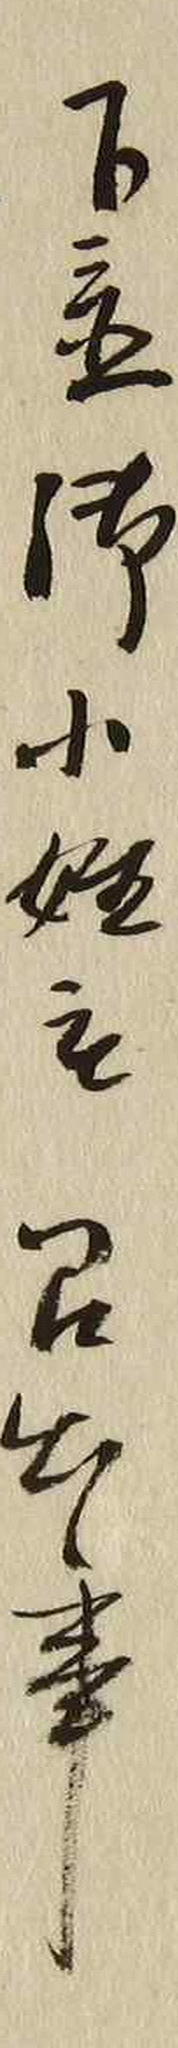下置御小姓被召出候事
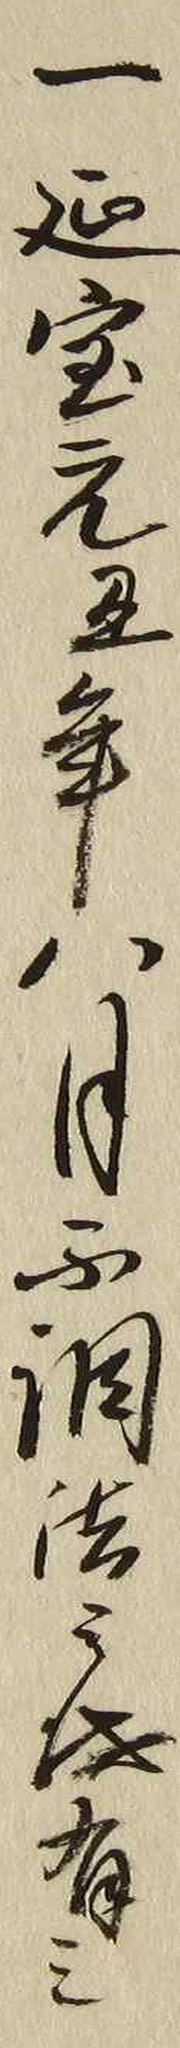一延宝元丑年八月不調法之儀有之
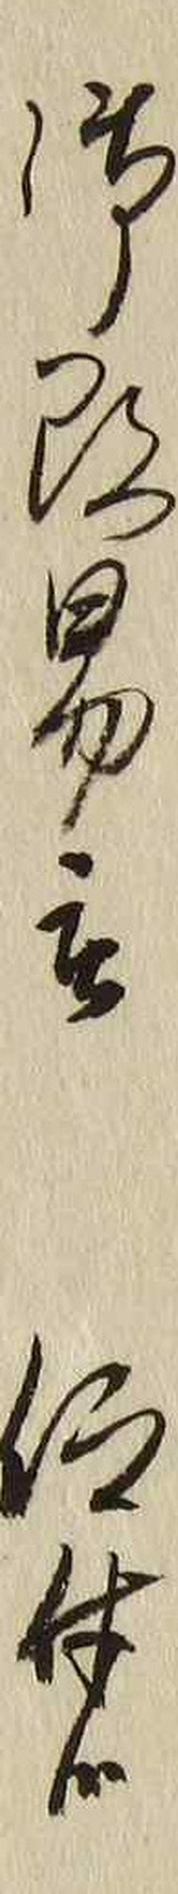御改易被仰付候
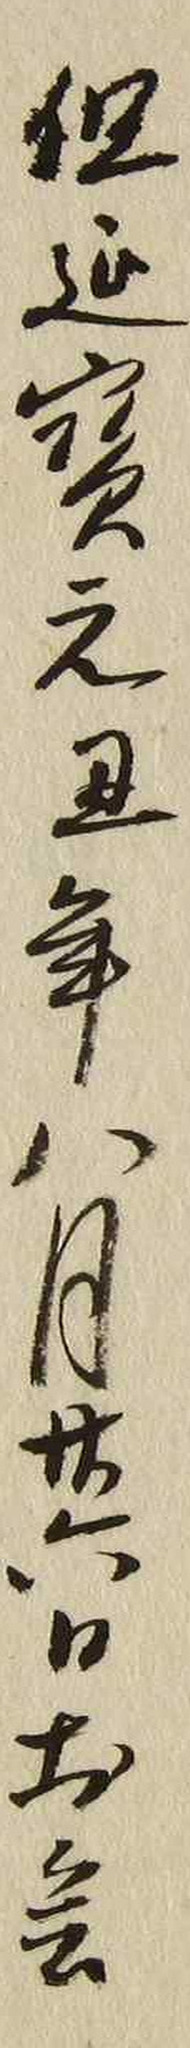但延宝元丑年八月廿六日於会
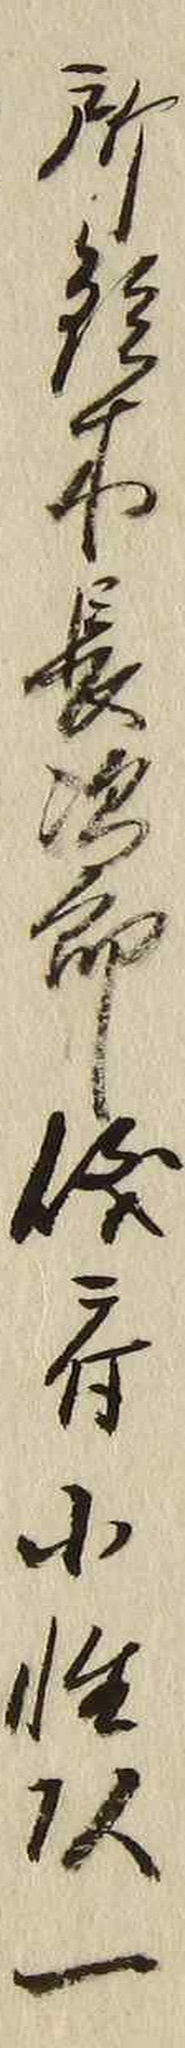所鈴木長次郎儀ニ付小性頭一
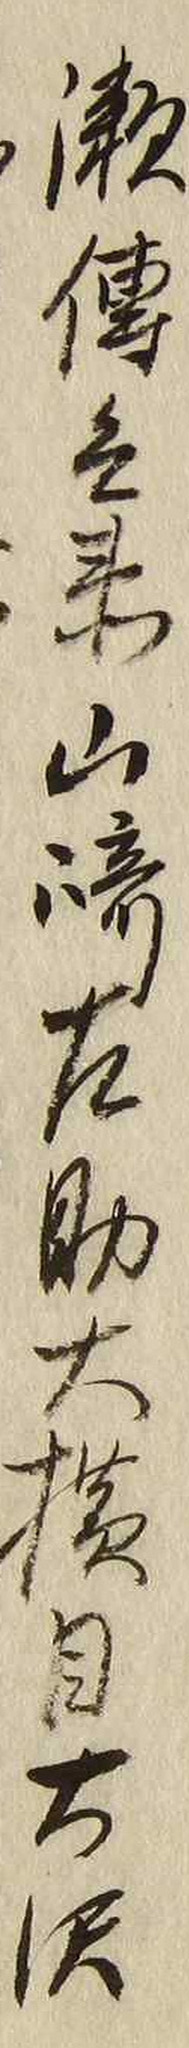瀬伝兵衛山崎左助大横目大沢
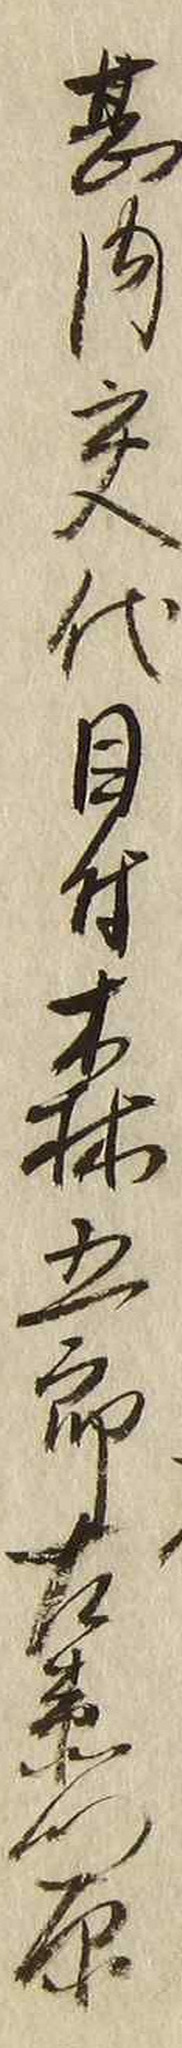甚内交代目付森五郎左衛門原

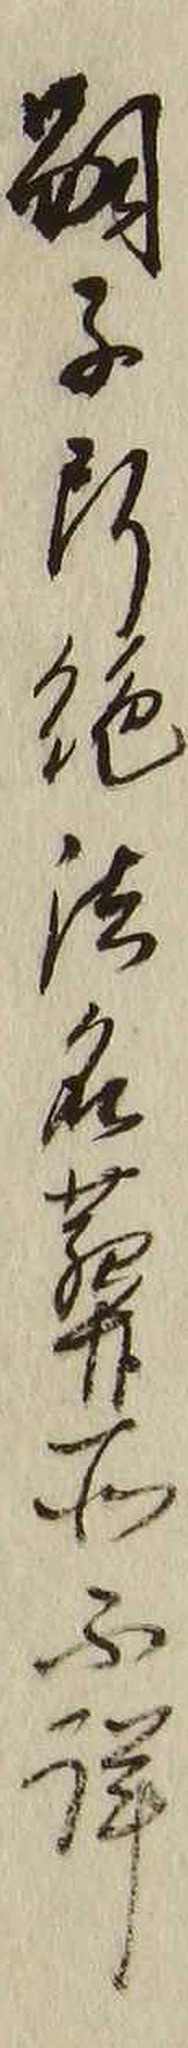嗣子断絶法名葬所不詳
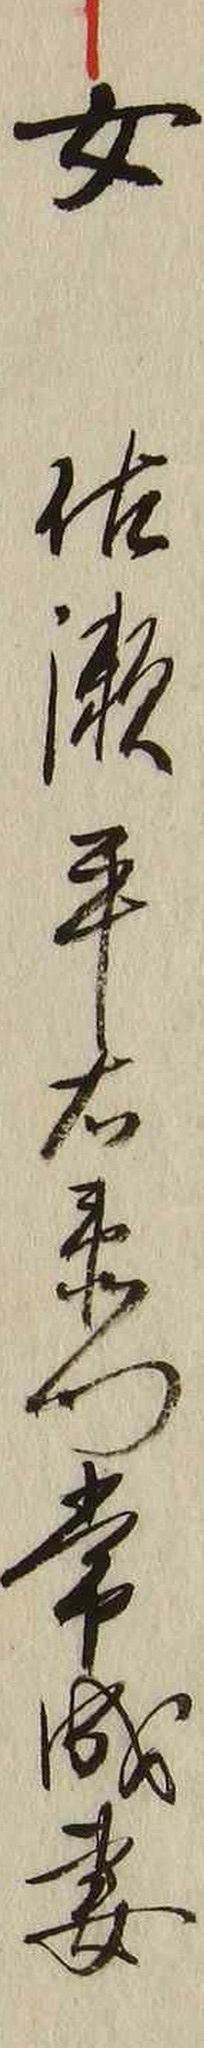女佐瀬平右衛門常成妻
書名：諸士系譜　巻之356　す之部6
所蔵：会津若松市立会津図書館
